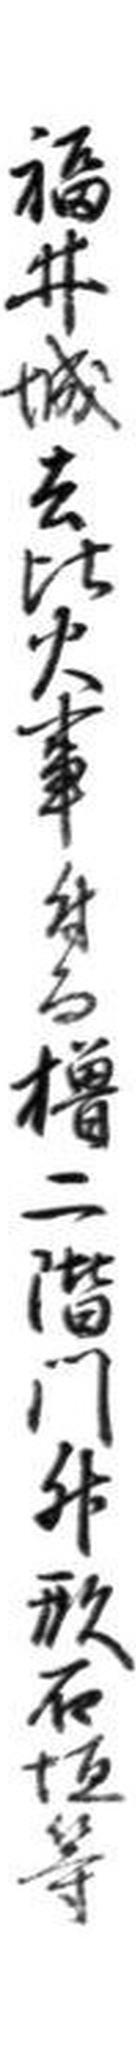福井城去比火事付而櫓二階門升形石垣等
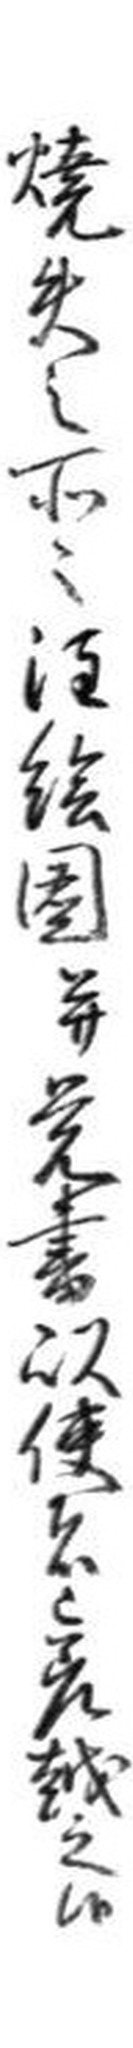焼失之所々注絵図并覚書以使者被差越之候
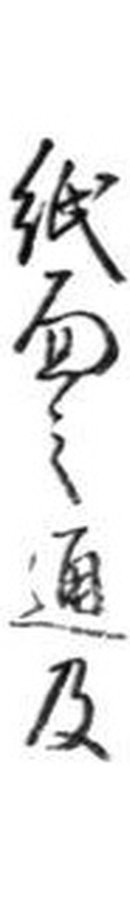紙面之通及
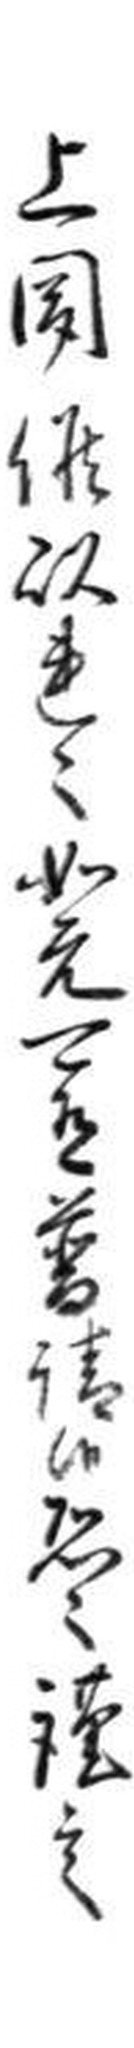上聞候以連々如元可有普請候恐々謹言
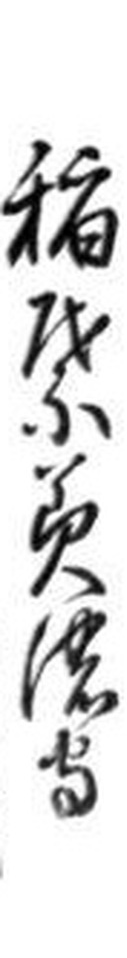稲葉美濃守
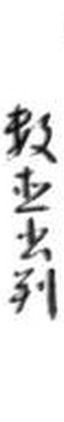数直書判
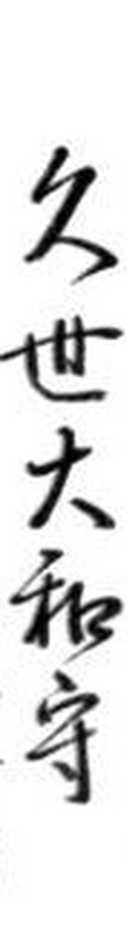久世大和守
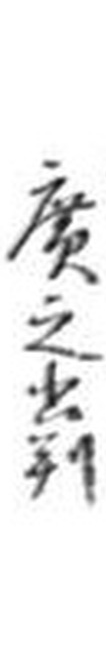広之書判
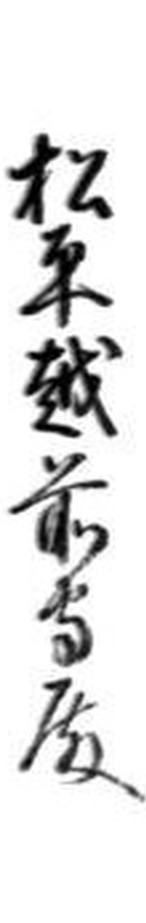松平越前守殿
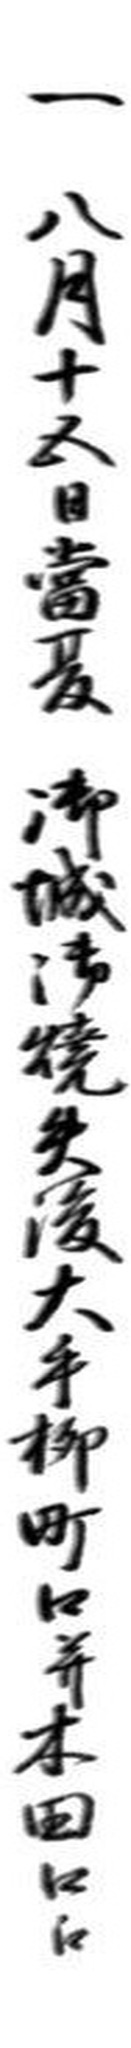一八月十五日当夏御城御焼失後大手柳町口并木田口江
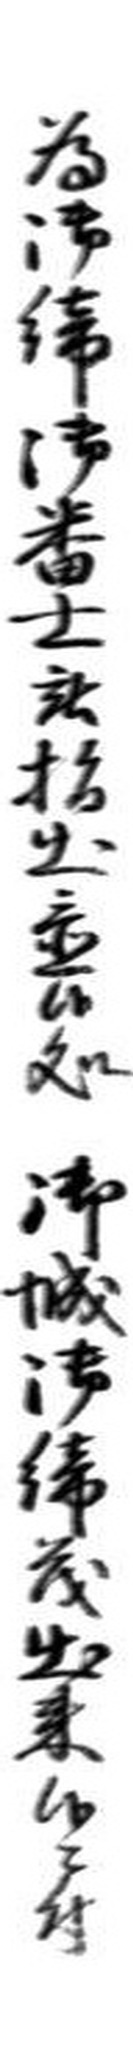為御締御番士被指出置候処御城御締も出来候ニ付
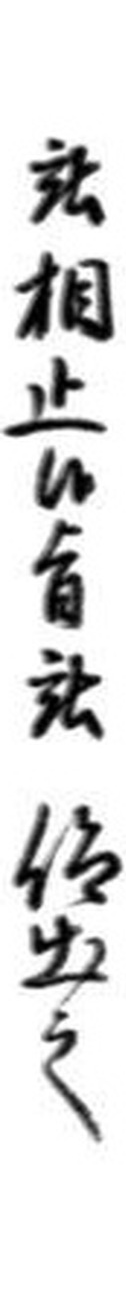被相止候旨被仰出之
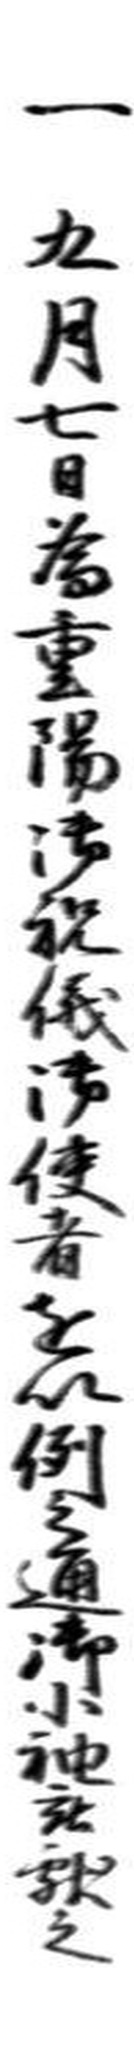一九月七日為重陽御祝儀御使者を以例之通御小袖被献之
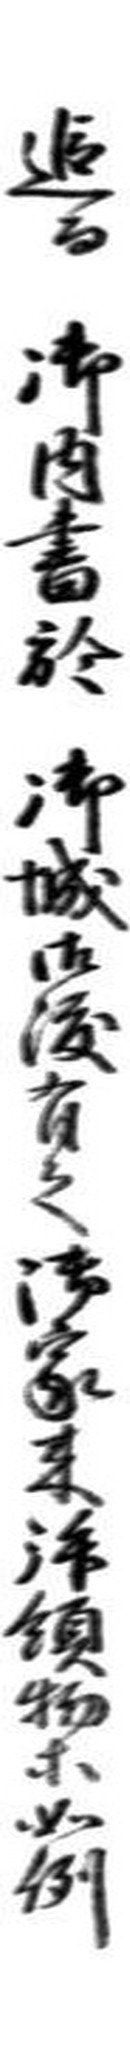追而御内書於御城御渡有之御家来拝領物等如例

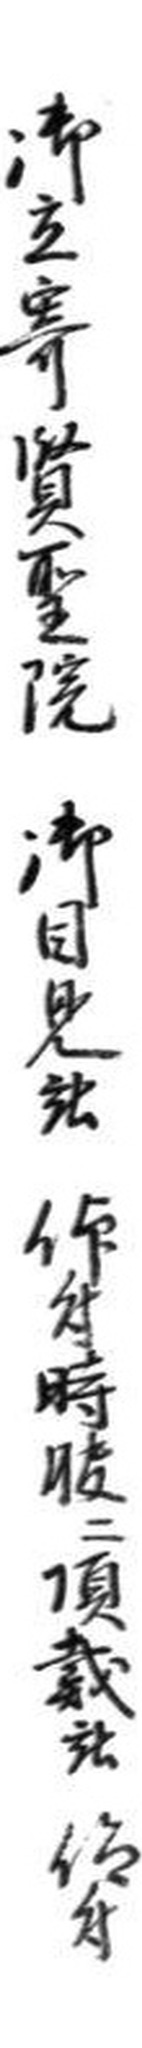御立寄賢聖院御目見被仰付時服二頂戴被仰付
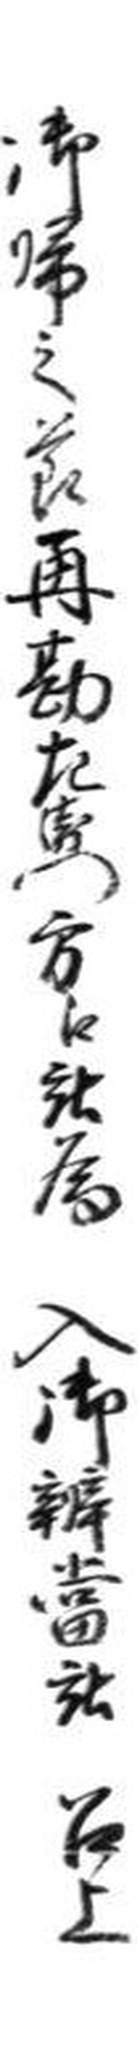御帰之節再勘左衛門方江被為入御弁当被召上
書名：家譜 七 光通公 従寛文四年到同九年
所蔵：福井県文書館 Fukui Prefectural Archives
